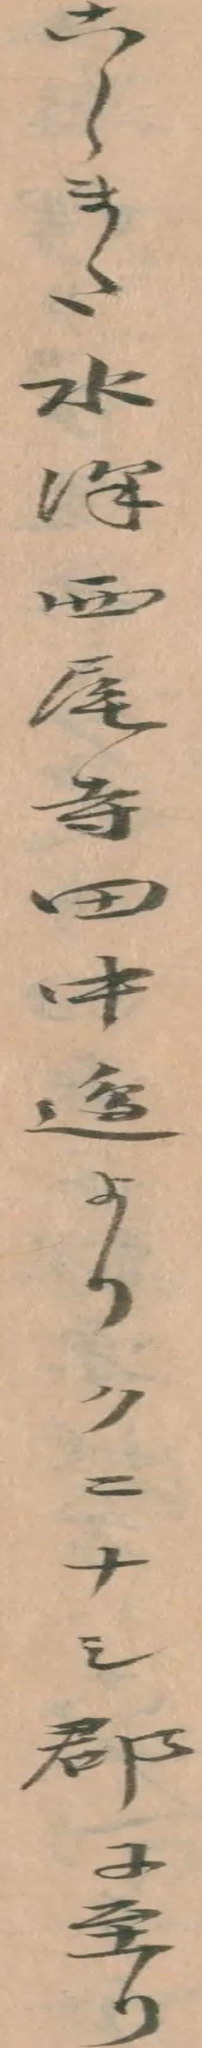こしまた水沢西尾寺田中辺ゟクニナシ郡に至り
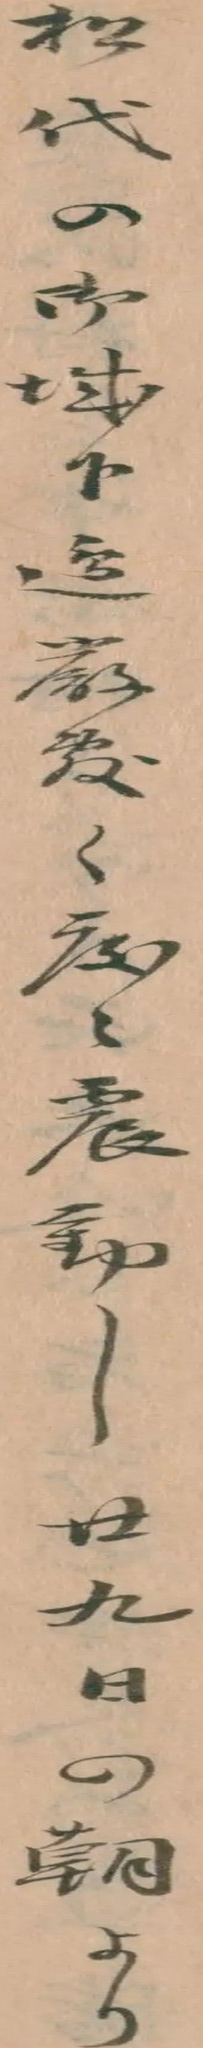松代の御城下辺厳敷く度々震動し廿九日の朝より
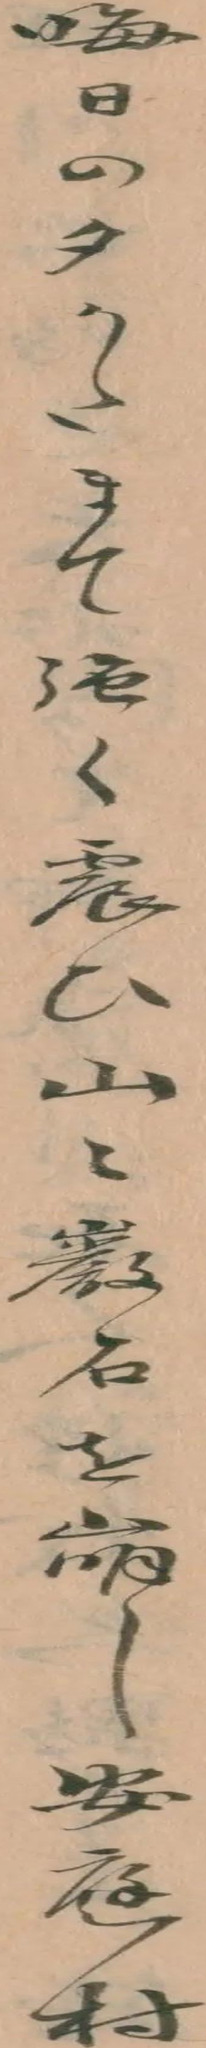晦日の夕かた迄強く震ひ山々巌石を崩し安庭村
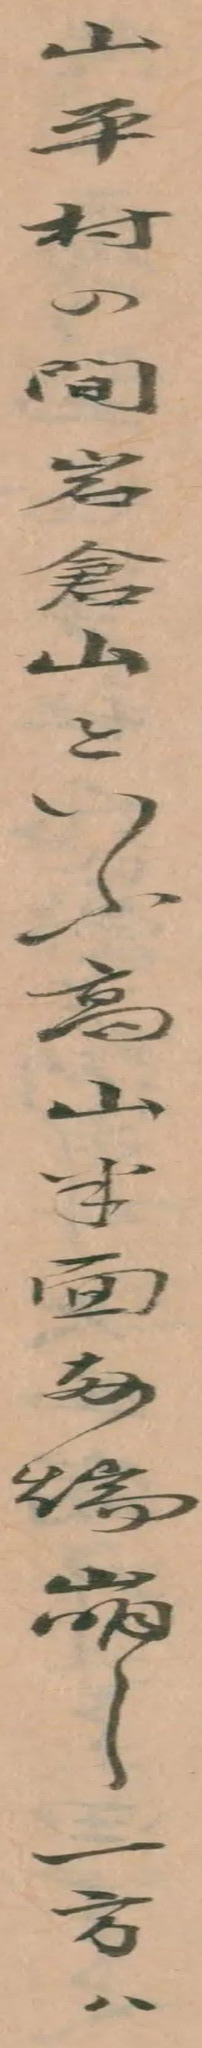山平村の間岩倉山といふ高山半面両端崩し一方ハ
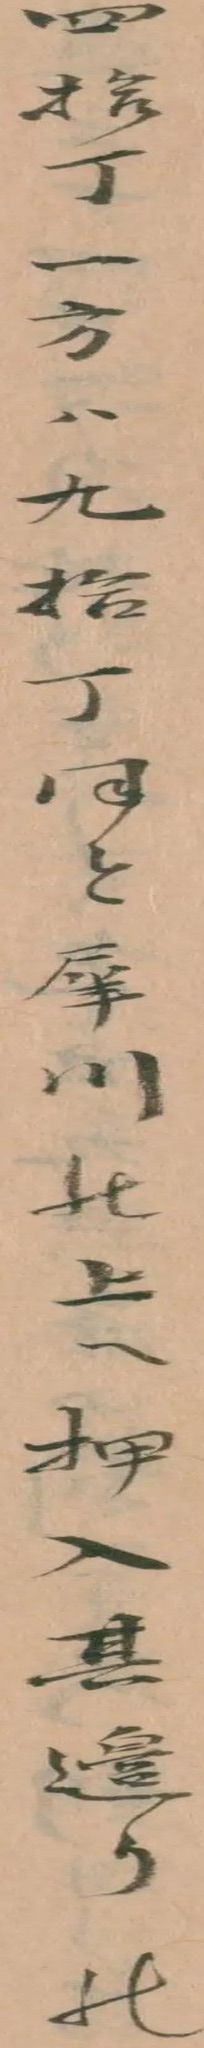四拾丁一方ハ九十町ほと犀川の上へ押入其辺りの
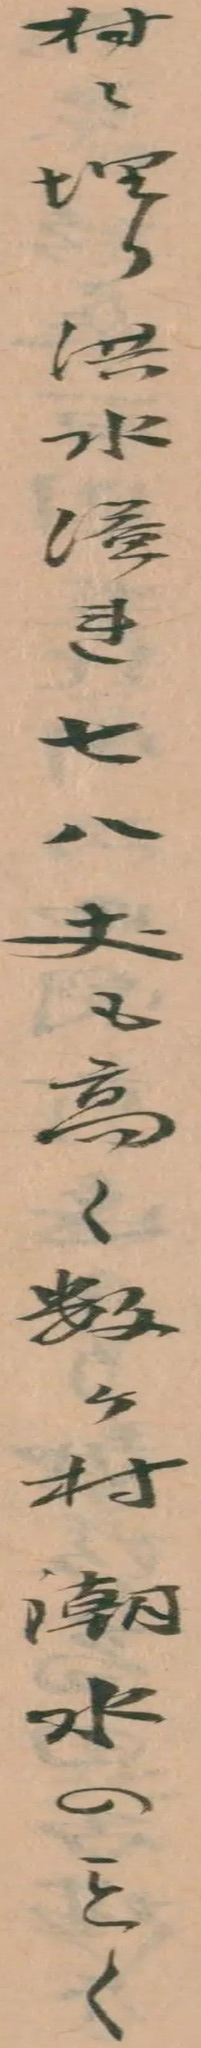村々埋り洪水溢れ七八丈も高く数ヶ村湖水のことく
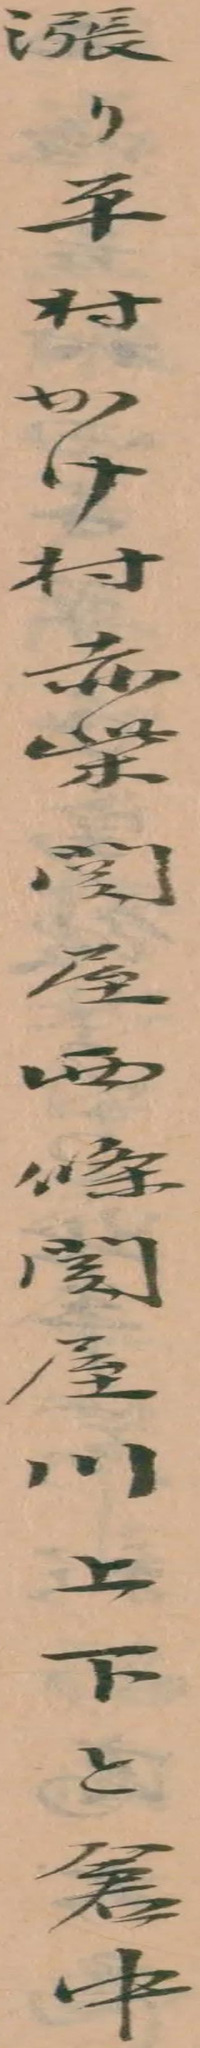漲り平村かけ村赤柴関屋西条関屋川上下と倉中
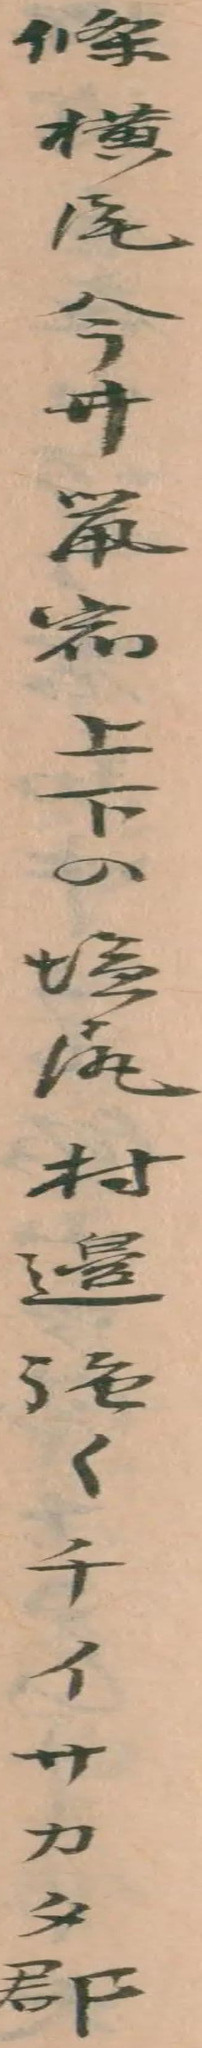條横尾今井鼠宿上下の塩尻村辺強くチイサカタ郡
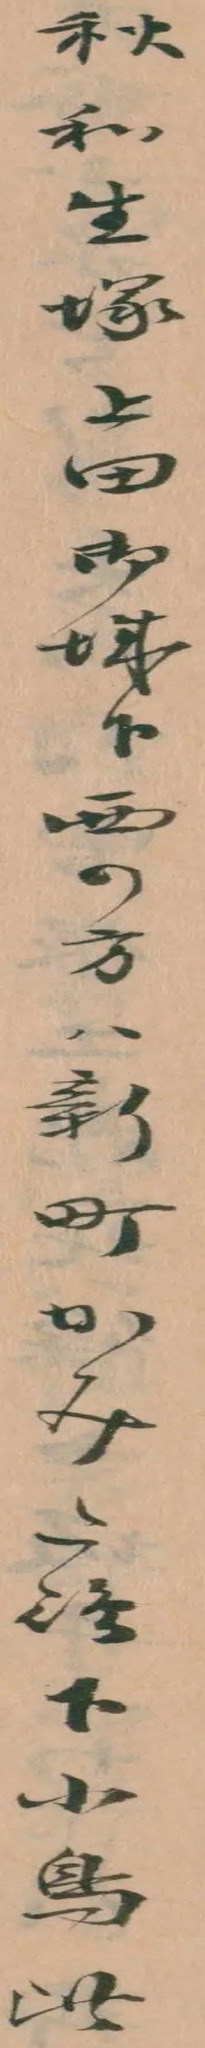秋和生塚上田御城下西の方ハ新町かみこ嶋下小嶋此
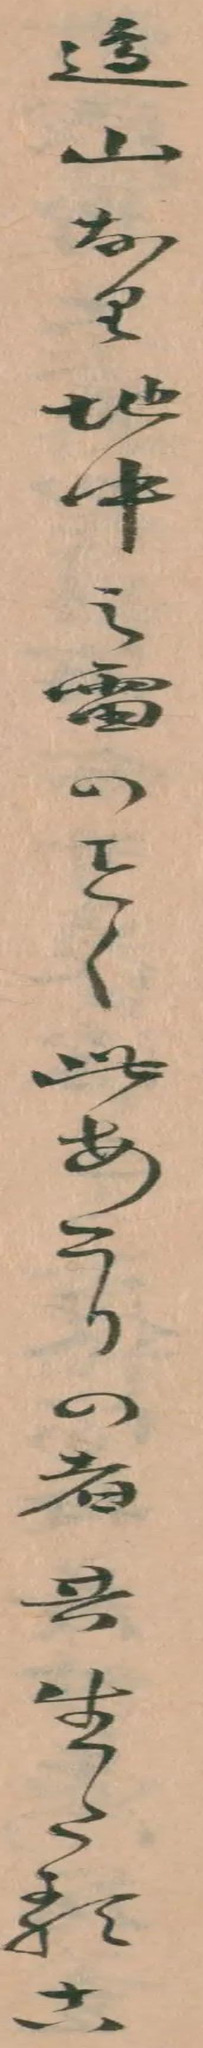辺山鳴地中之雷のことく此あたりの者共生たるこ
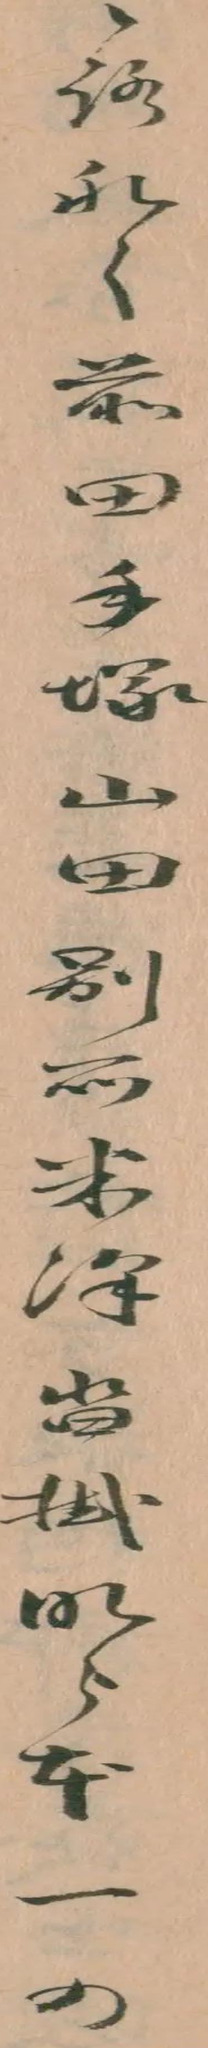ゝちなく前田手塚山田別所米沢沓掛なら本一の
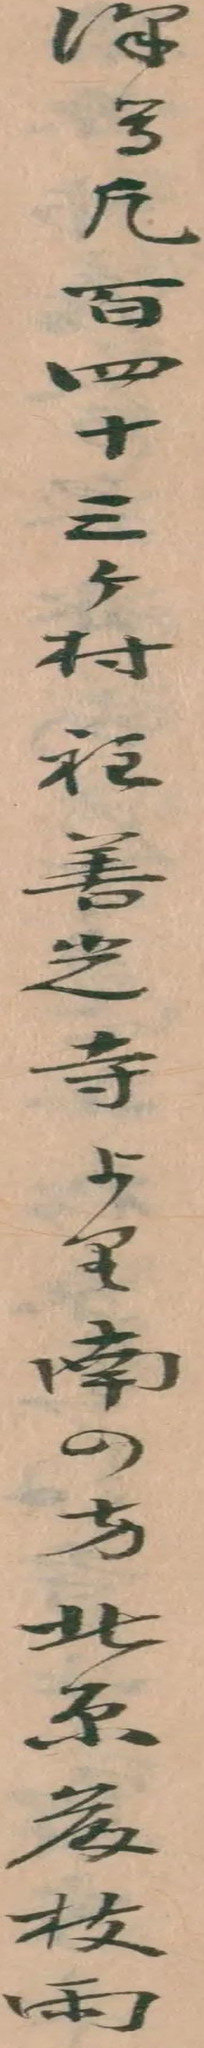沢等凡百四十三ヶ村程善光寺より南の方北原藤枝雨
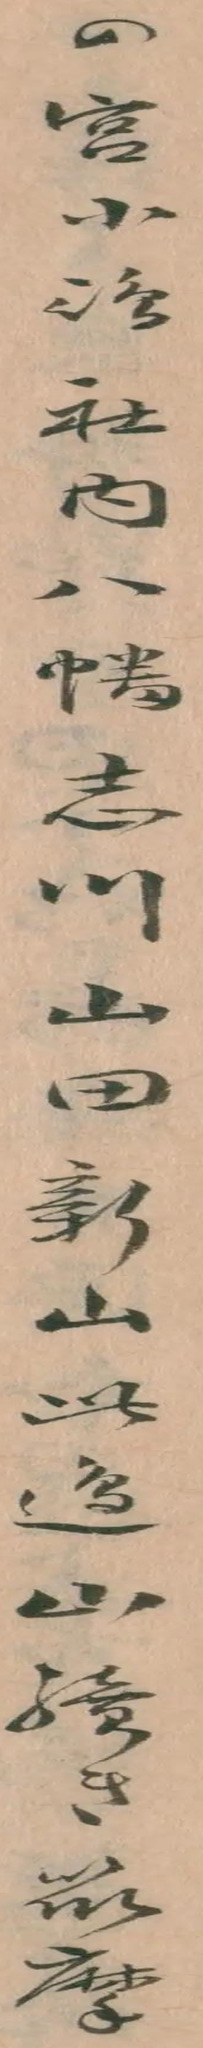の宮小嶋社向八幡志川山田新山此辺山つつき筑摩
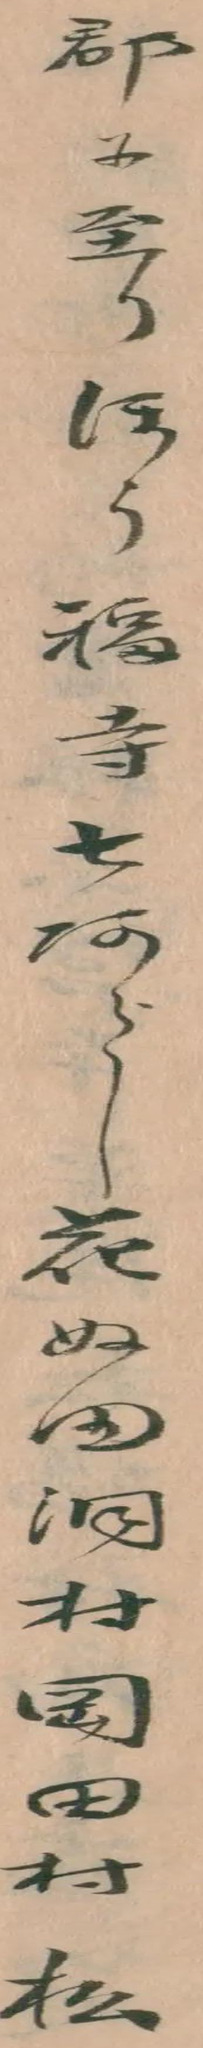郡二至りほう福寺七ならし花ぬた洞村岡田村松
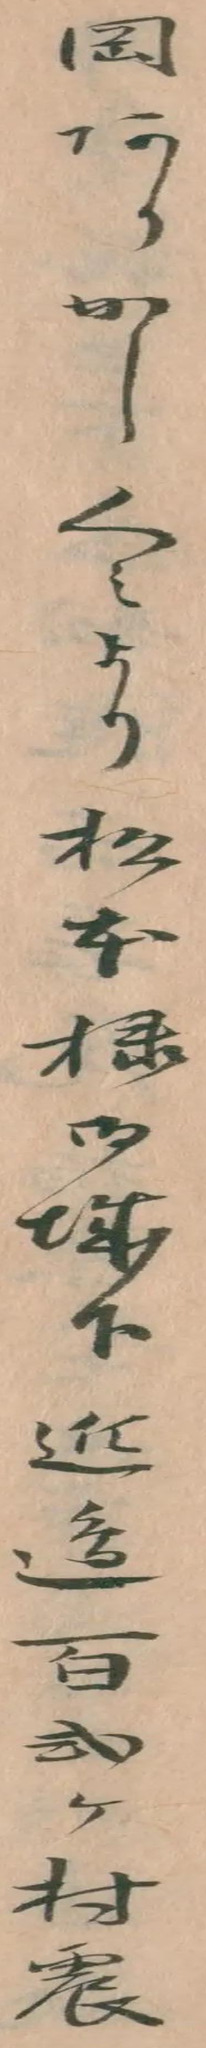岡ありかねくみより松本様御城下近辺百弐ヶ村震
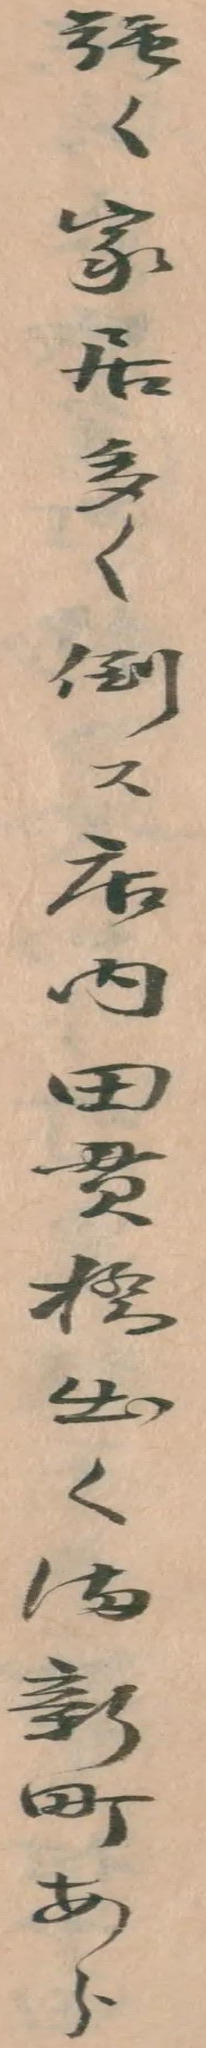強く家居多く倒ス庄内田貫橋むくま新町あら
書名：地災撮要. 巻3(地震之部)-巻4(噴火之部)
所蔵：国立国会図書館 National Diet Library, JAPAN
